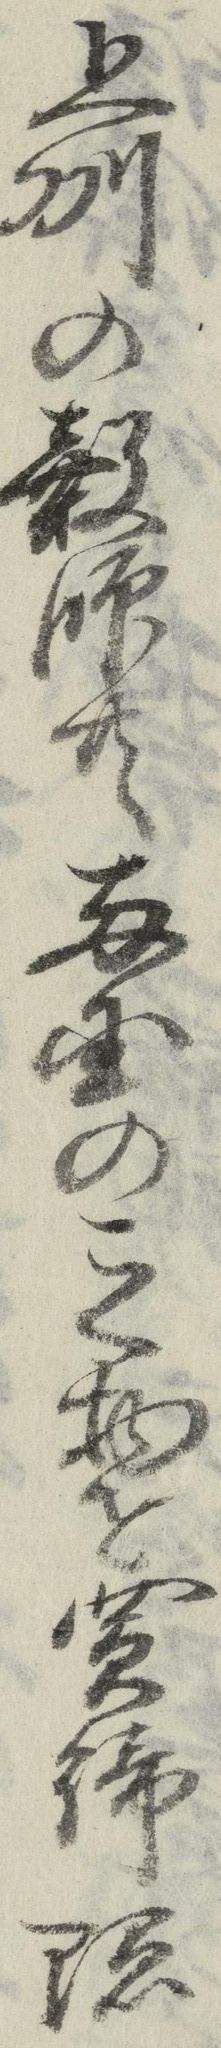上州の穀師共両国のこく物を買締隠
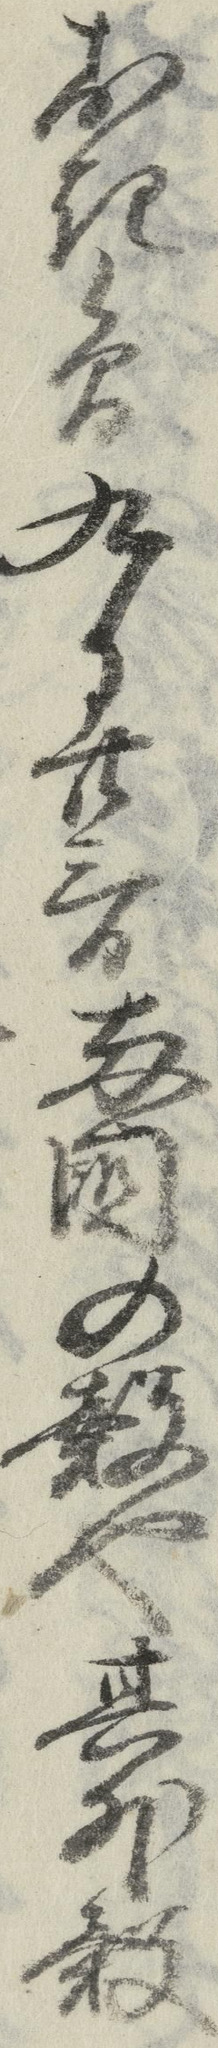おき候間九月廿三日両国の穀や其外穀
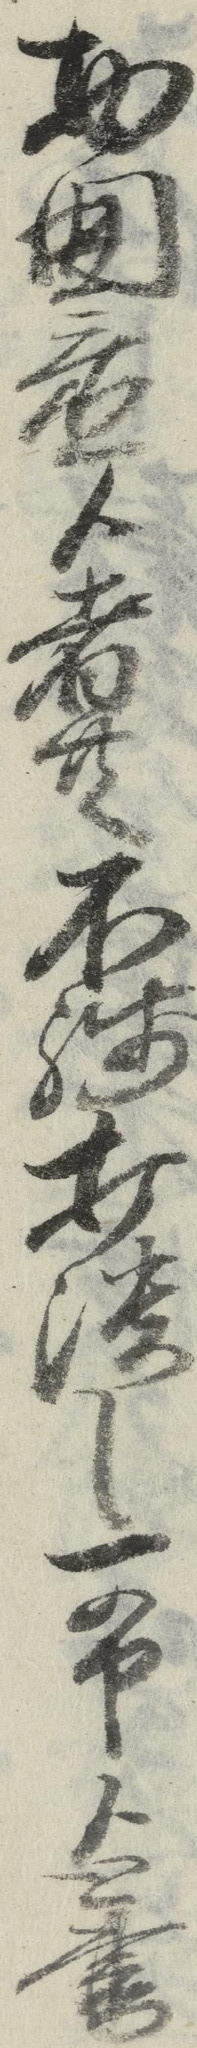物囲置候者共不残打潰し可申候と書
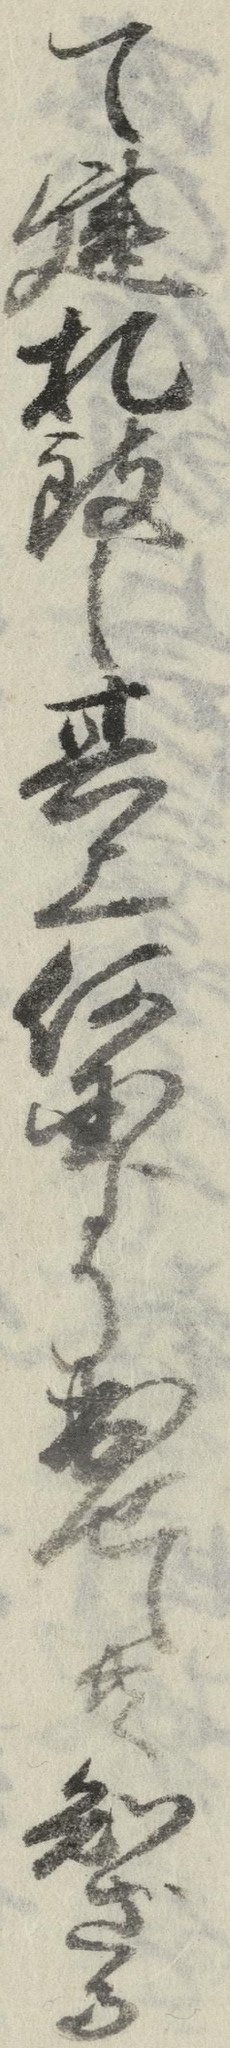て建札致し其上何国より出せし共知ざる
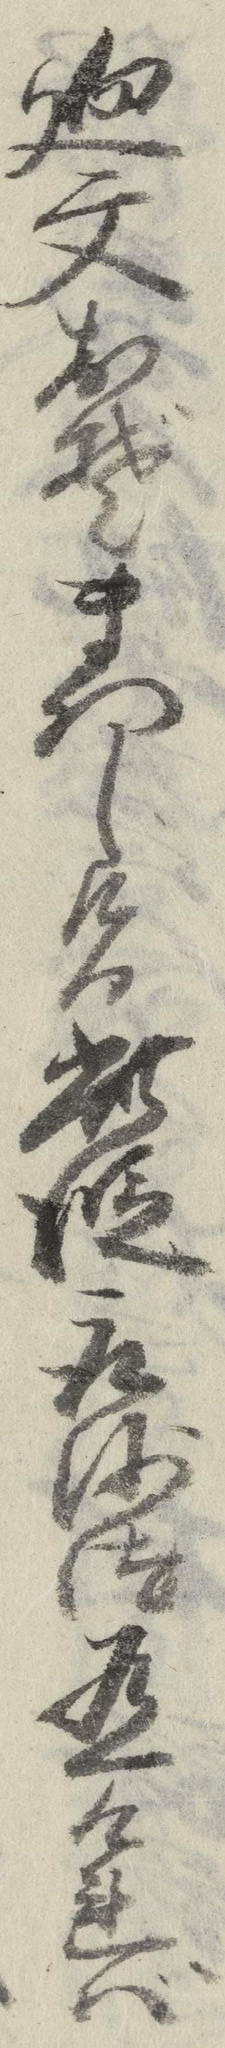廻文おぞまわしける此段取沙汰有ければ
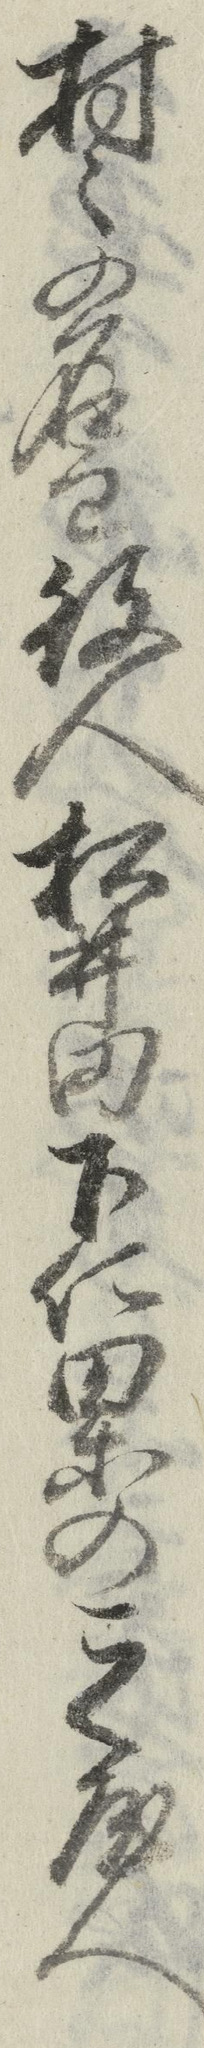村々の名主役人松井田下仁田等のこく屋人
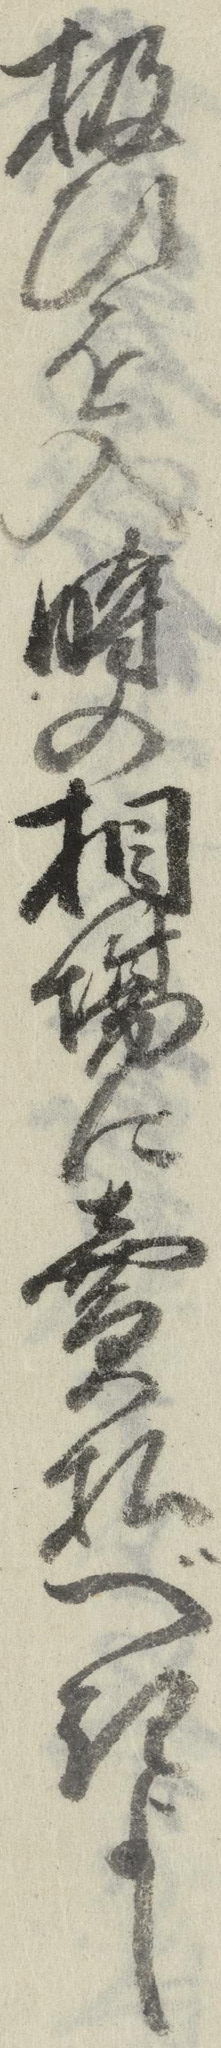扱ひを入時の相場に売払べきよし

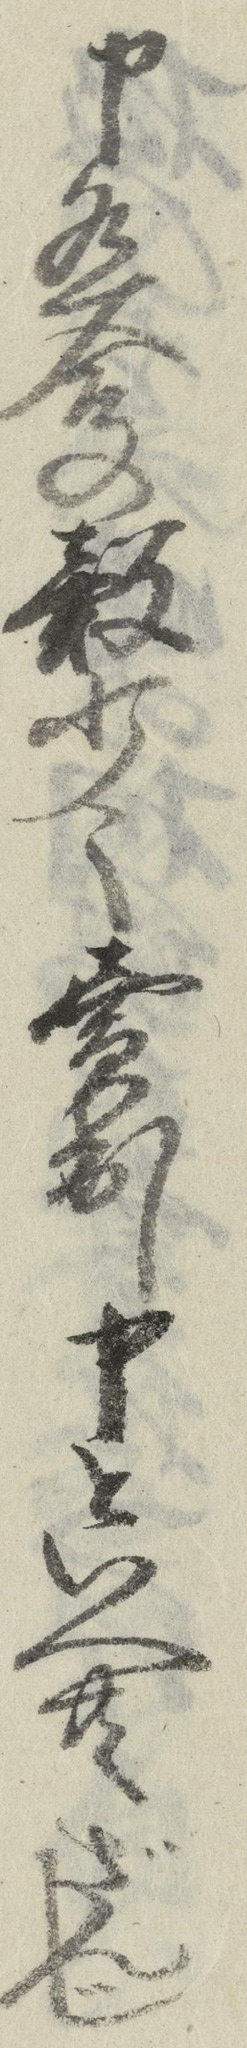申有合の穀少〻売出し申といへ共ざんじ
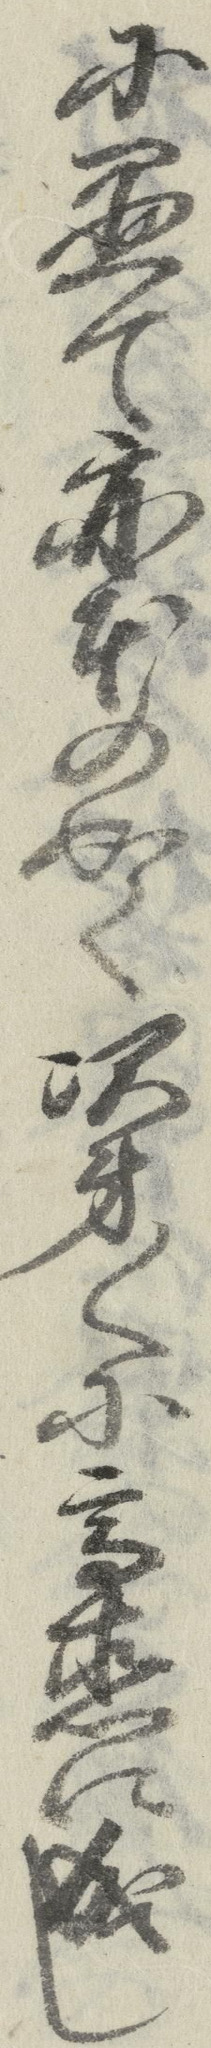に画て亦本の如く次第〳〵に高直に成し
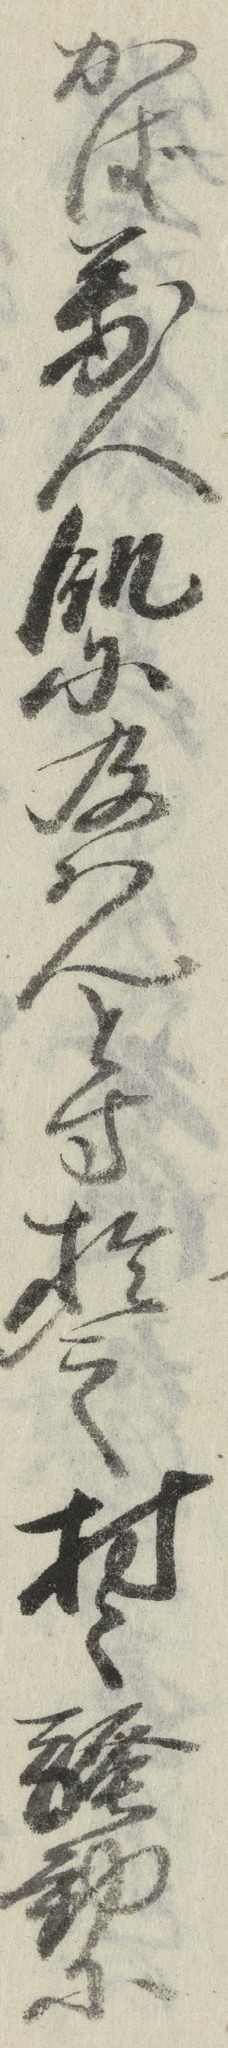かば万人飢に及はんとす於之村々騒動に
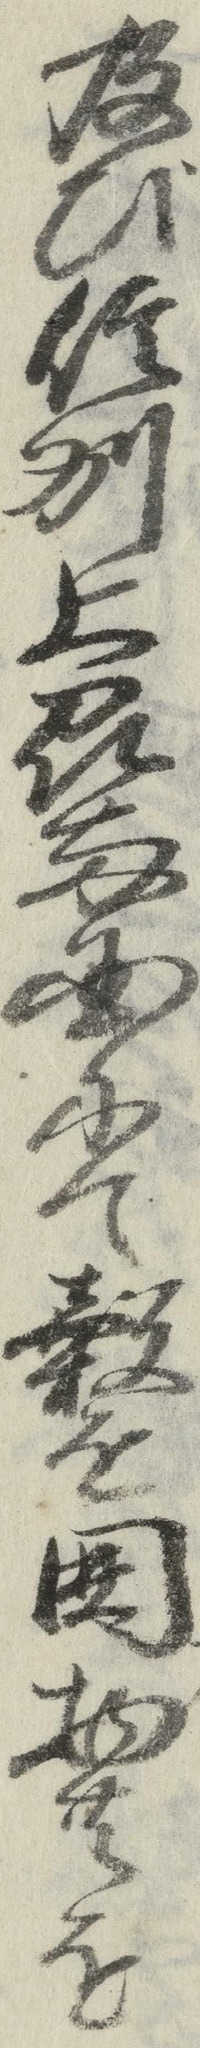及び信州上州両国にて穀を囲物共を
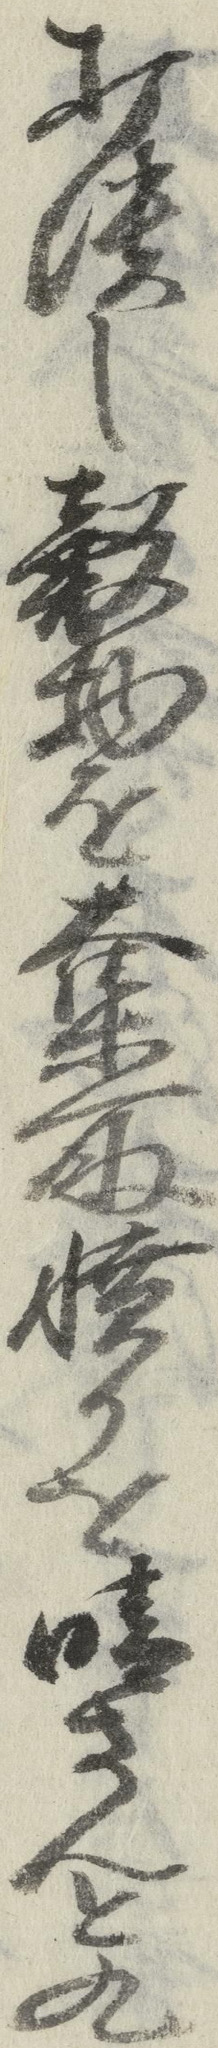打潰し穀物を奪取憤りを晴さんと九
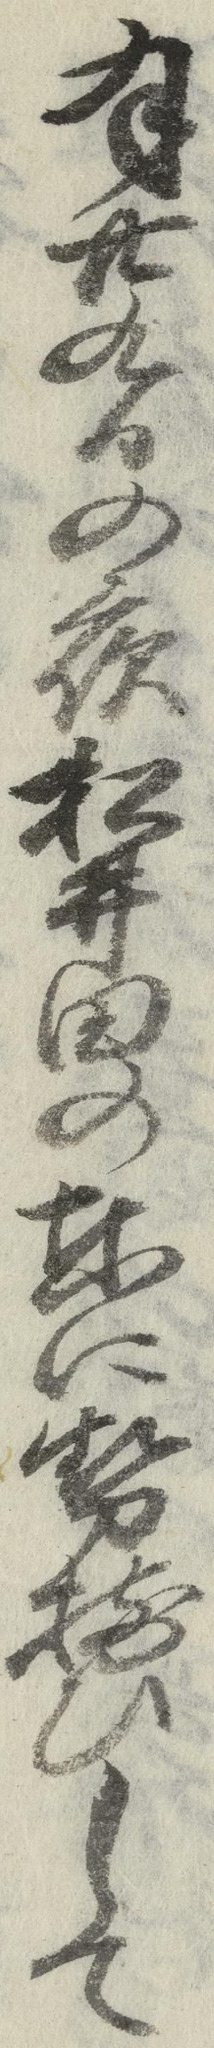月廿九日の夜松井田の東に勢揃ひして
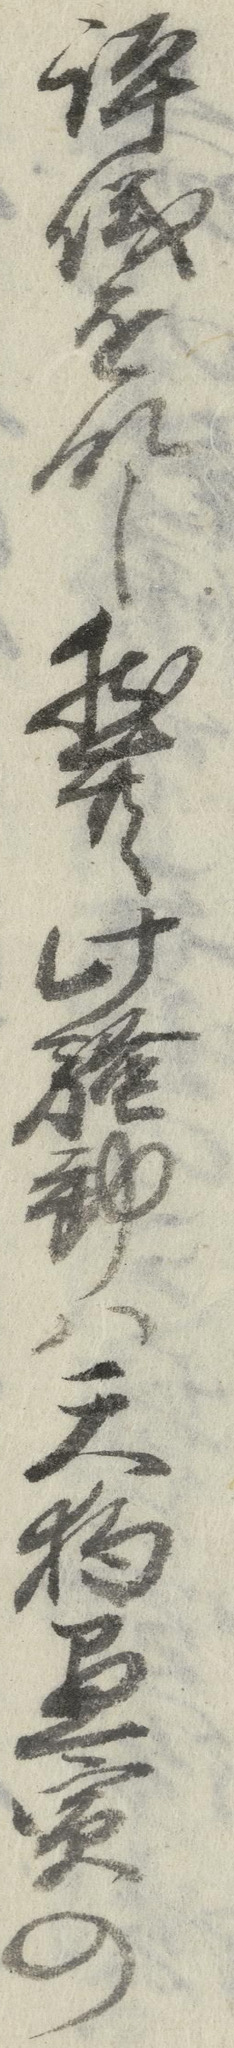評儀をなし然共此騒動は天狗愚寅の
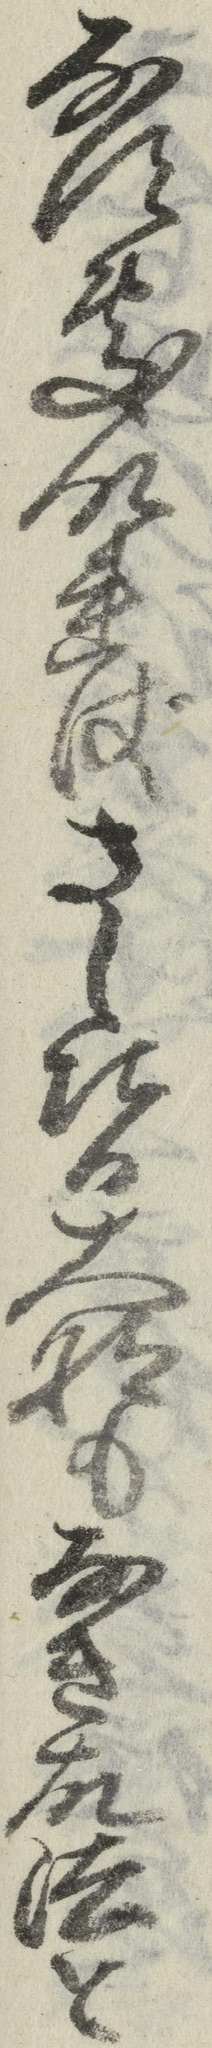なす処なればさしたる大将もなき故法と
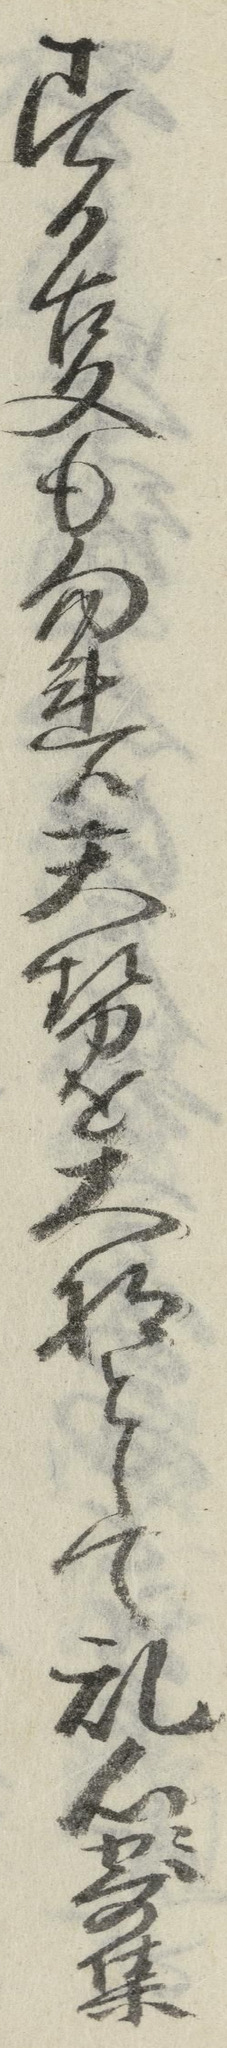する事も勿れは天勢を大将として乱心に寄集
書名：浅間大焼騒動記　中
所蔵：東京大学地震研究所図書室 Earthquake Research Institute Library, The University of Tokyo, JAPAN
